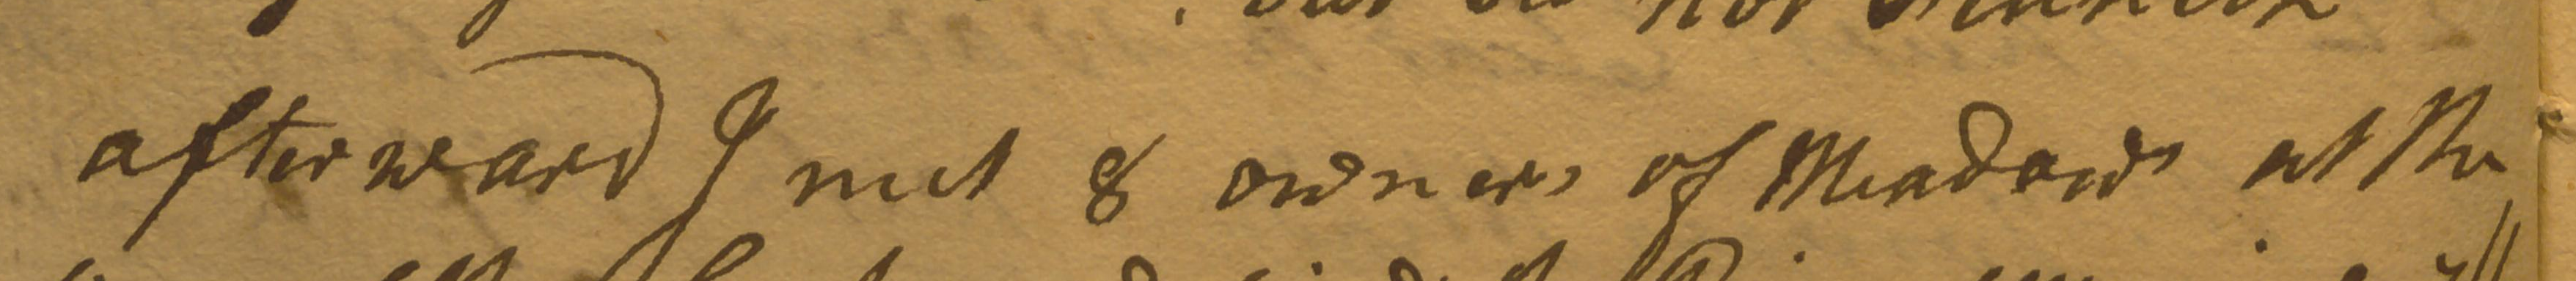afterward I met 8 owners of Meadows at the
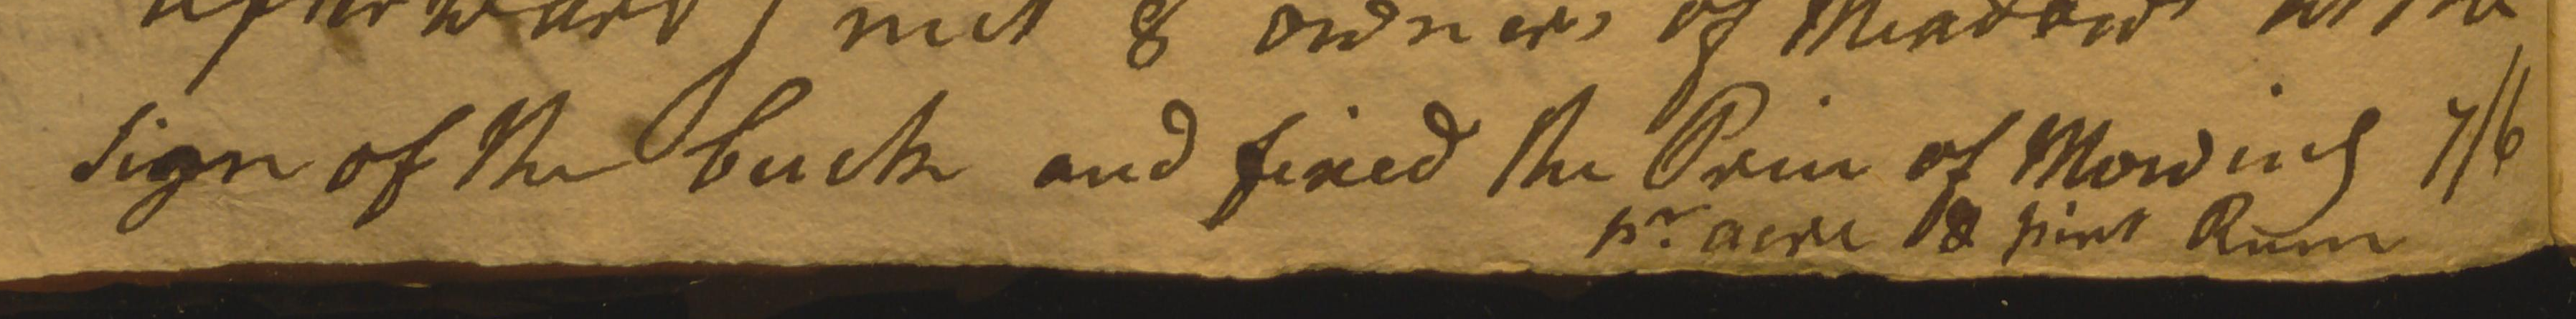sign of the buck and fixed the Price of Mowing 7s6
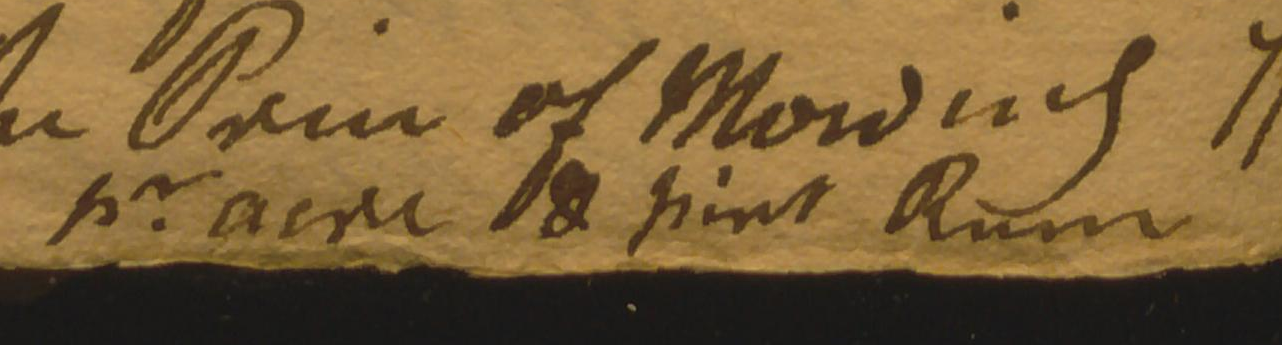p^r. acre & pint Rum
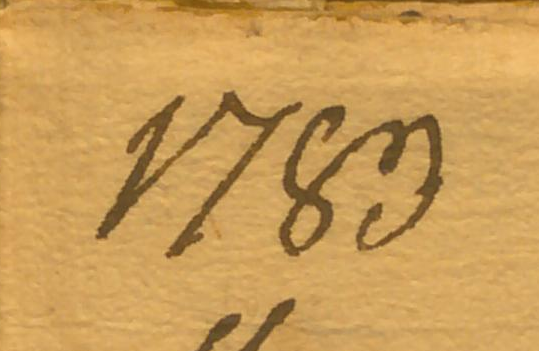1783
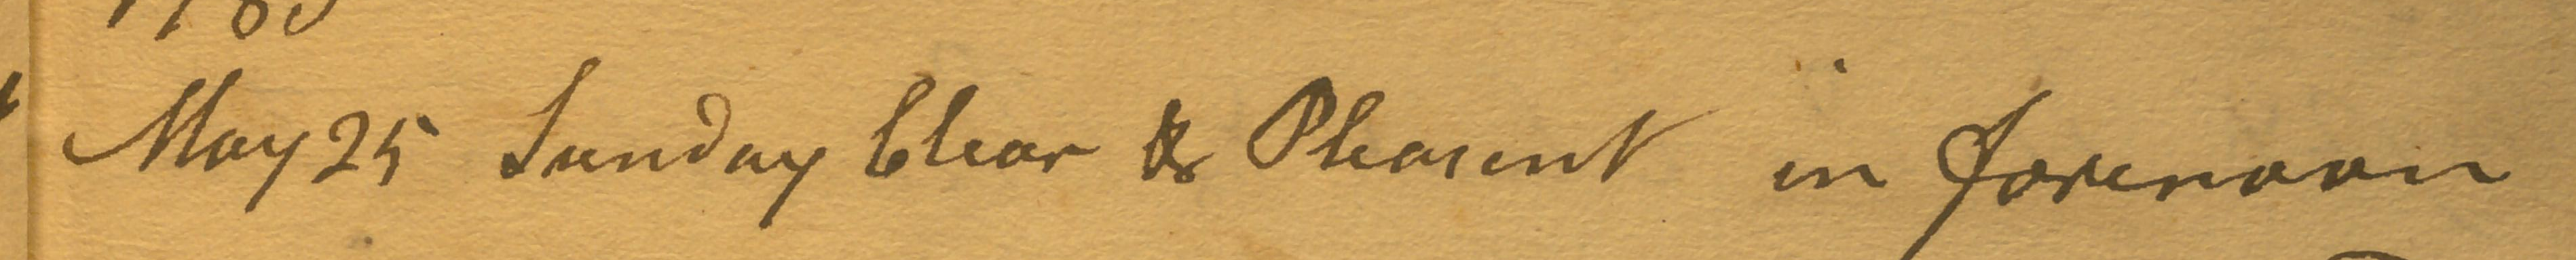May 25 Sunday Clear & Pleasent in forenoon
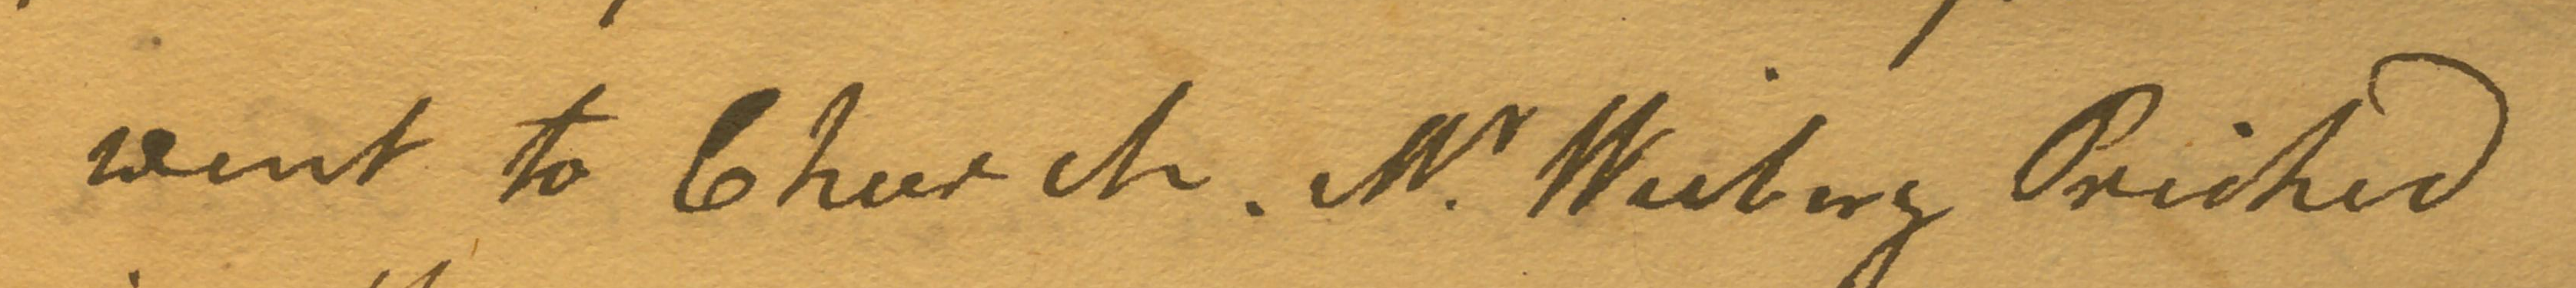went to Church, M^r. Weiberg Priched
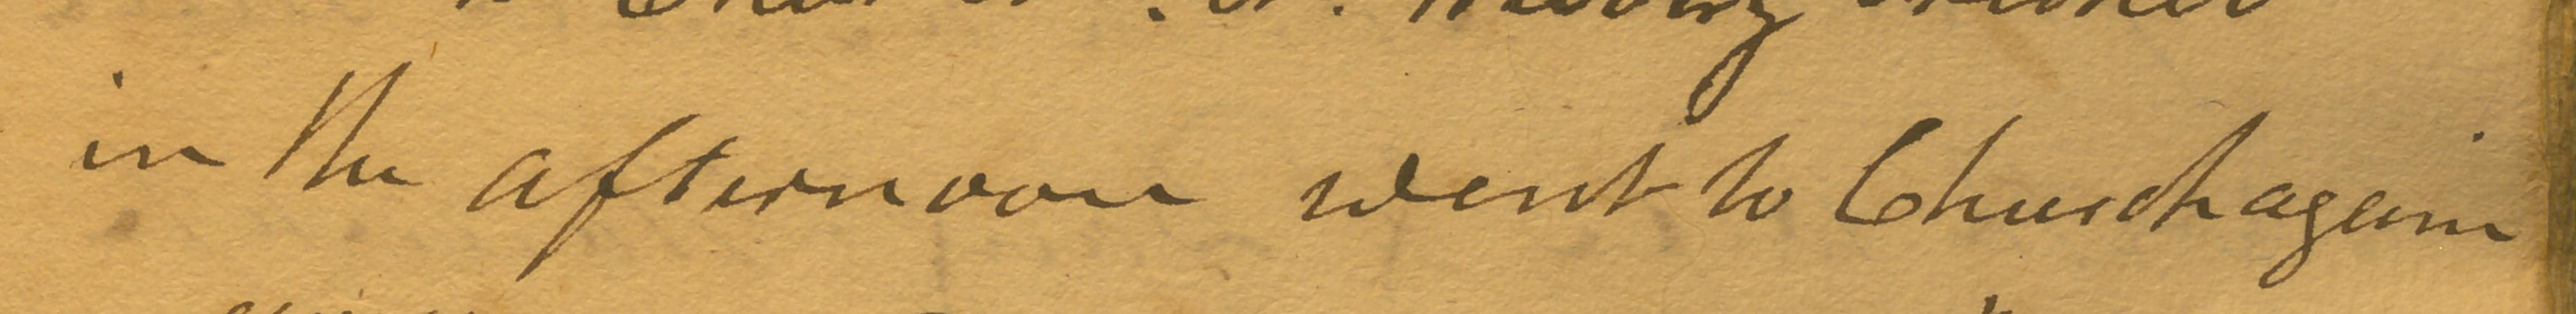in the afternoon went to Church again
